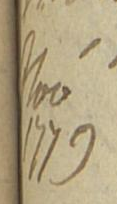Nov^r
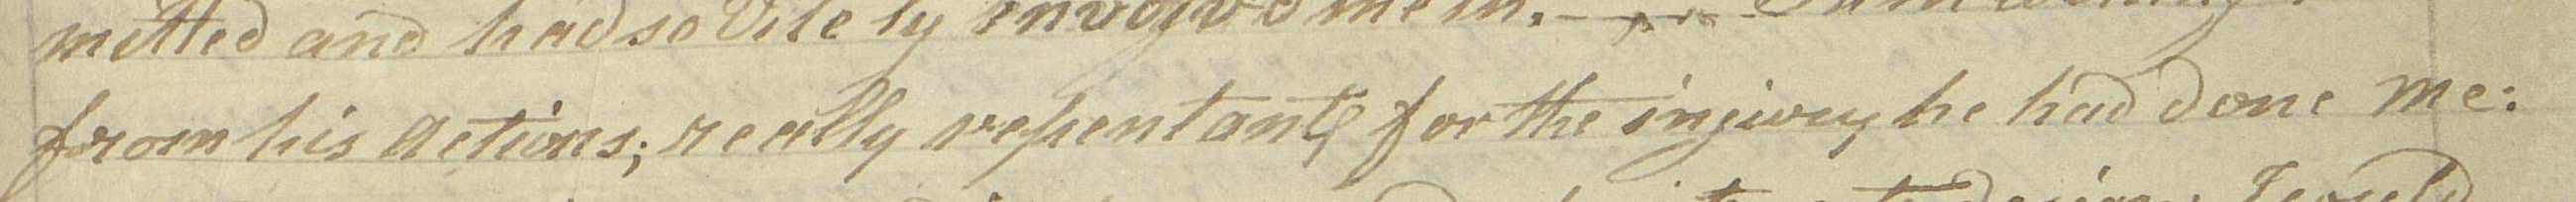from his Actions; really repentant for the injury he had done me.
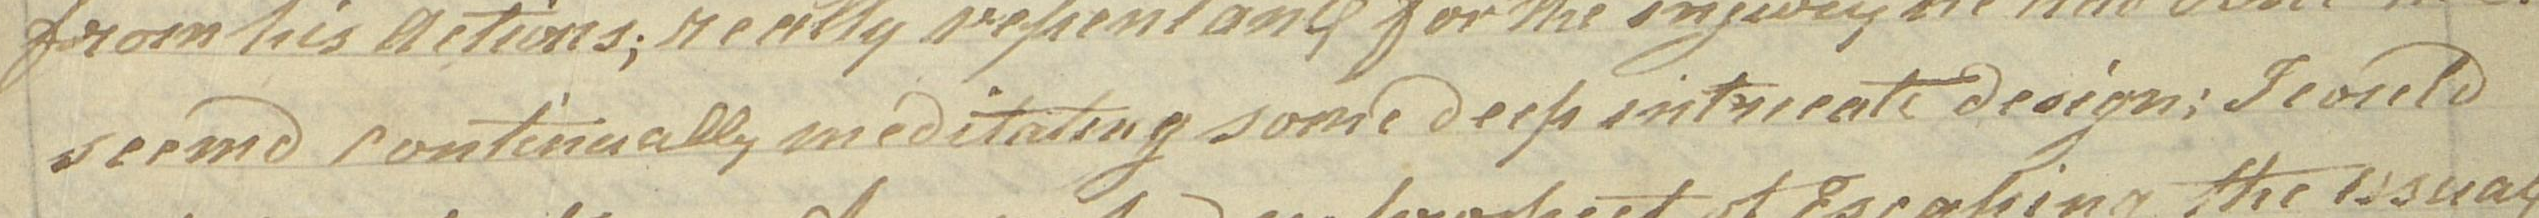seemd continually meditating some deep intricate design; I could
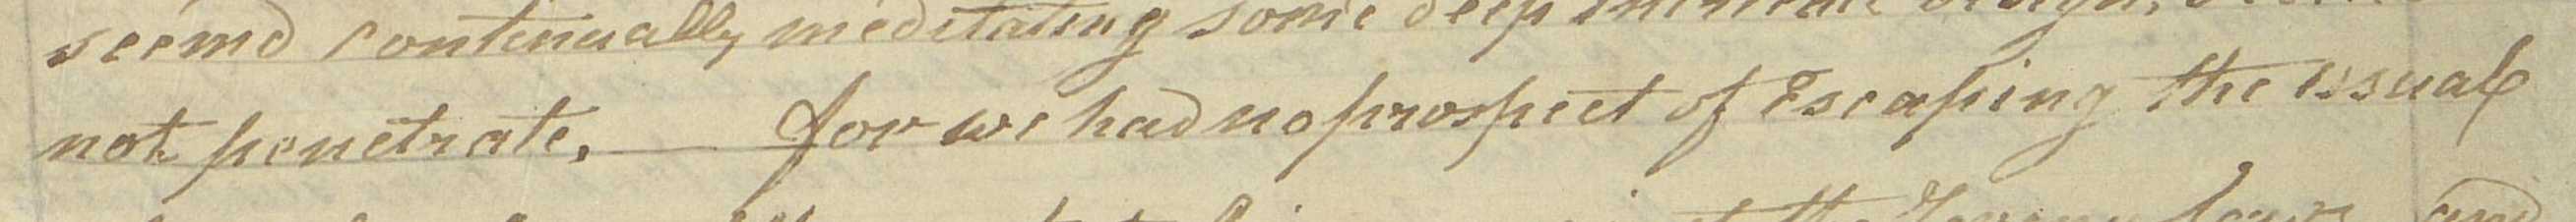not penetrate. for we had no prospect of Escaping the usual
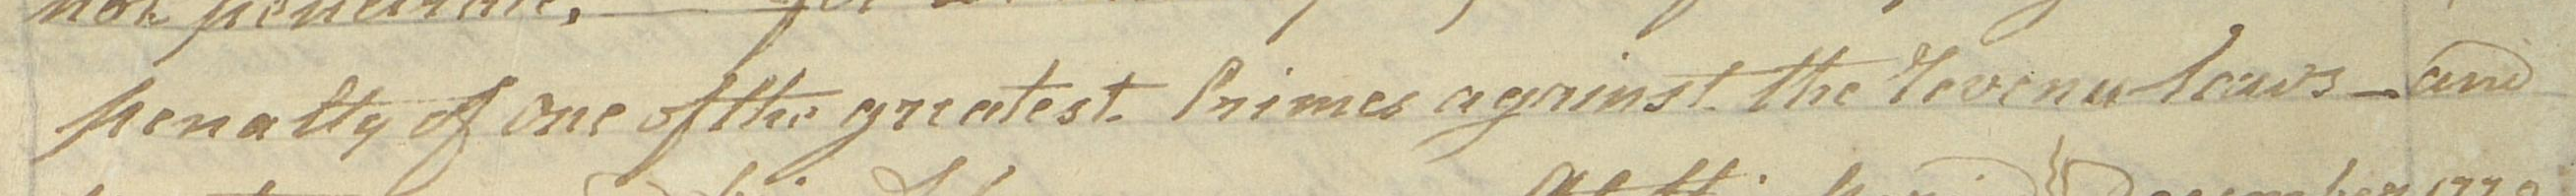penalty of one of the greatest Crimes against the revenu laws, and
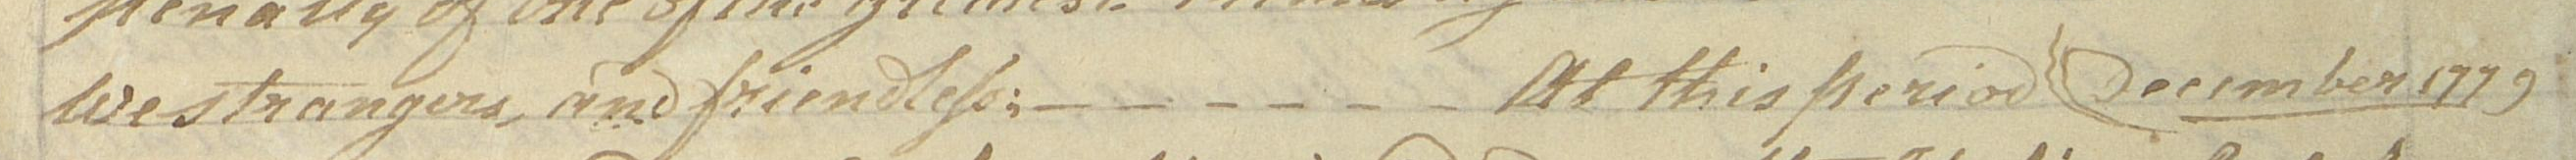We strangers and friendless. At this period (December 1779
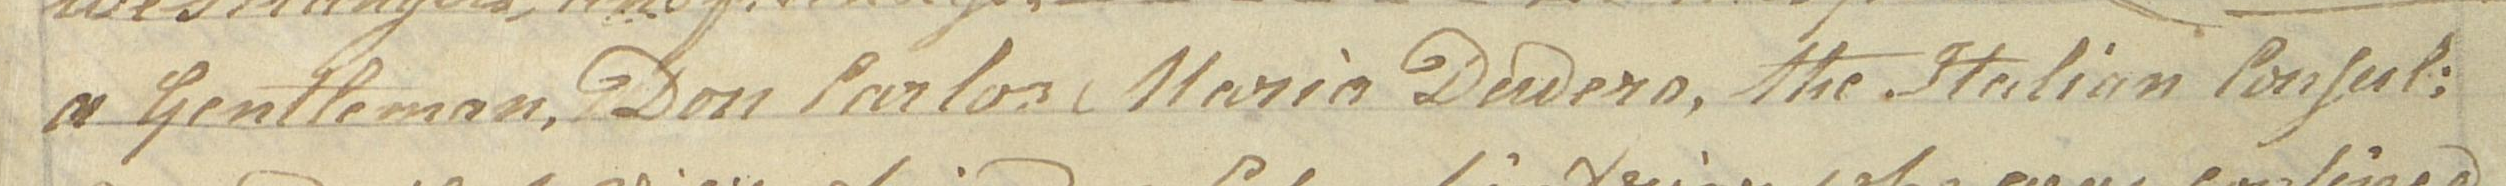a Gentleman Don Carlos Maria Dudero, the Italian Consul:
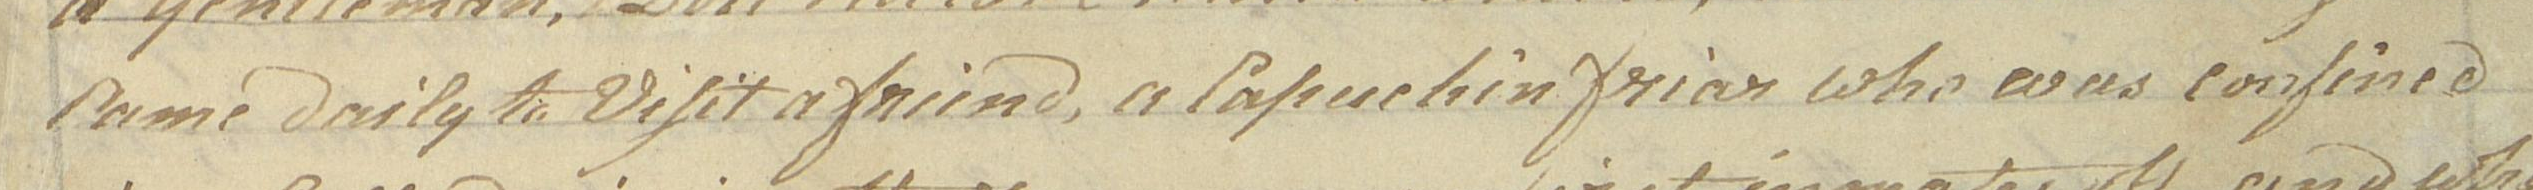Came daily to Visit a friend, a Capuchin friar who was confined
